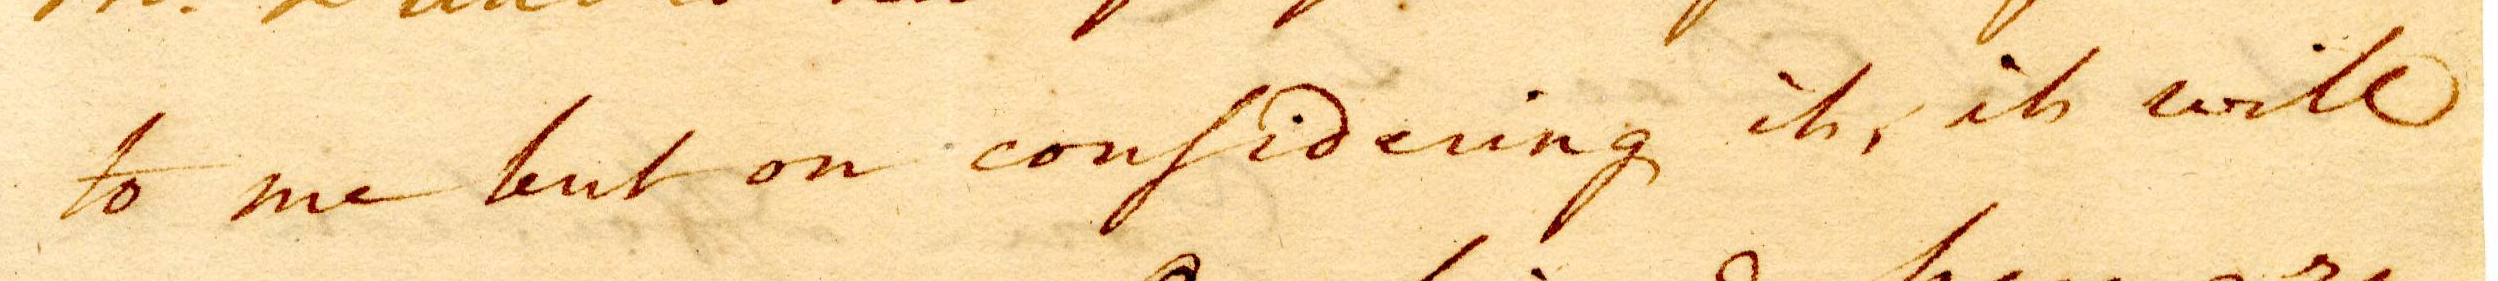to me but on considering it, it will
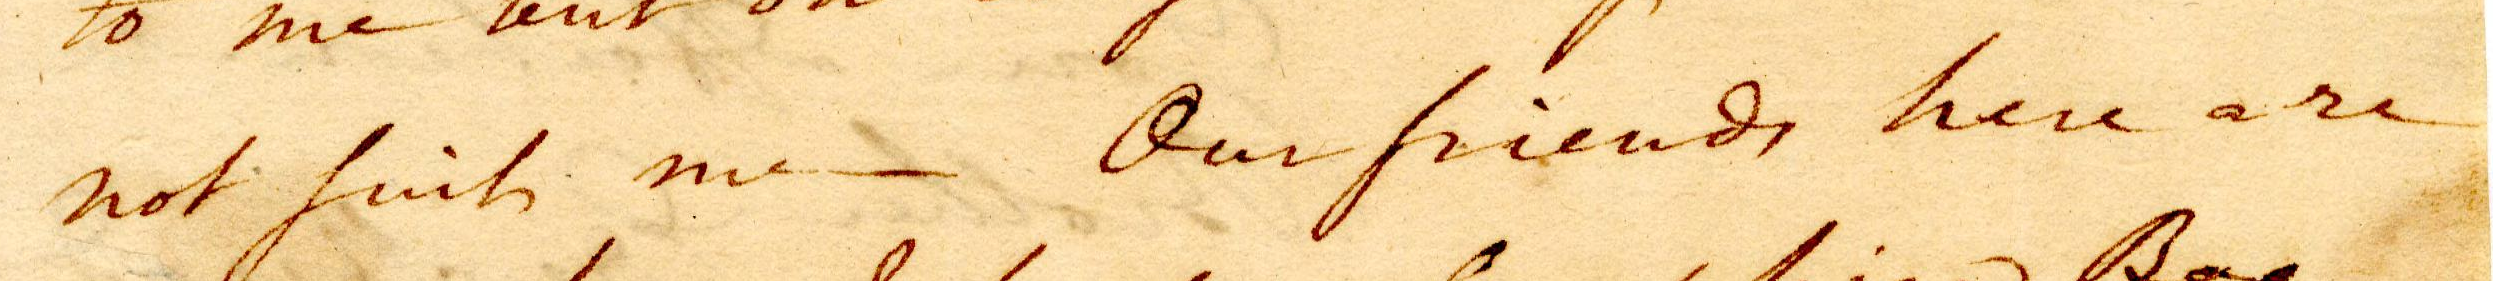not suit me. Our friends here are
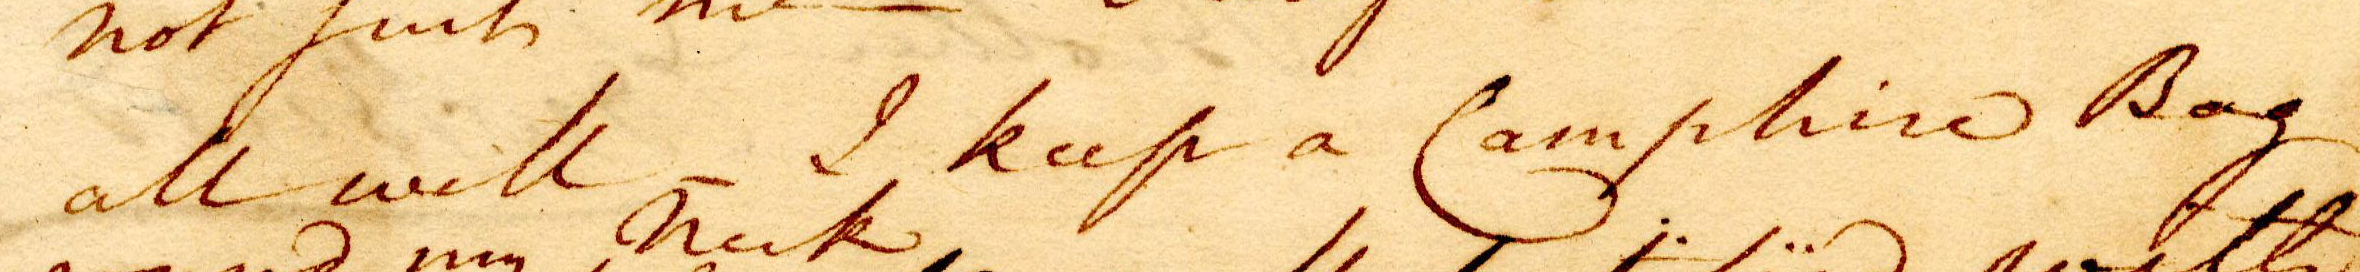all well. I keep a Camphire Bag
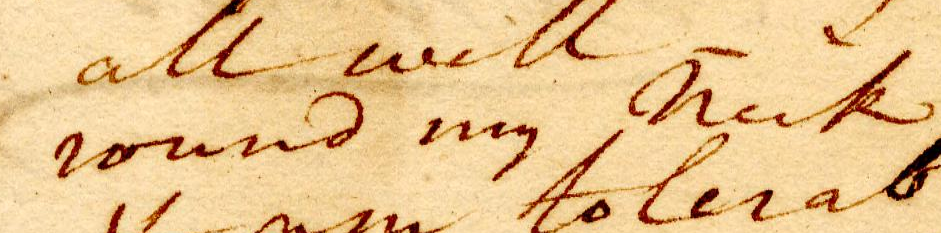round my Neck
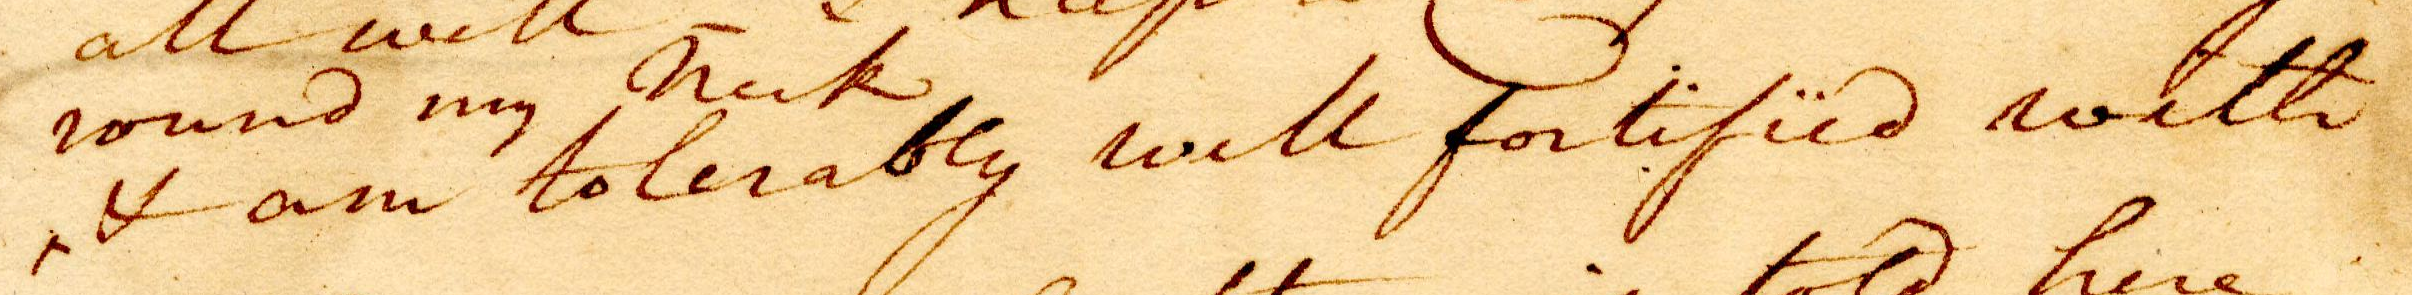^ & am tolerably well fortified with
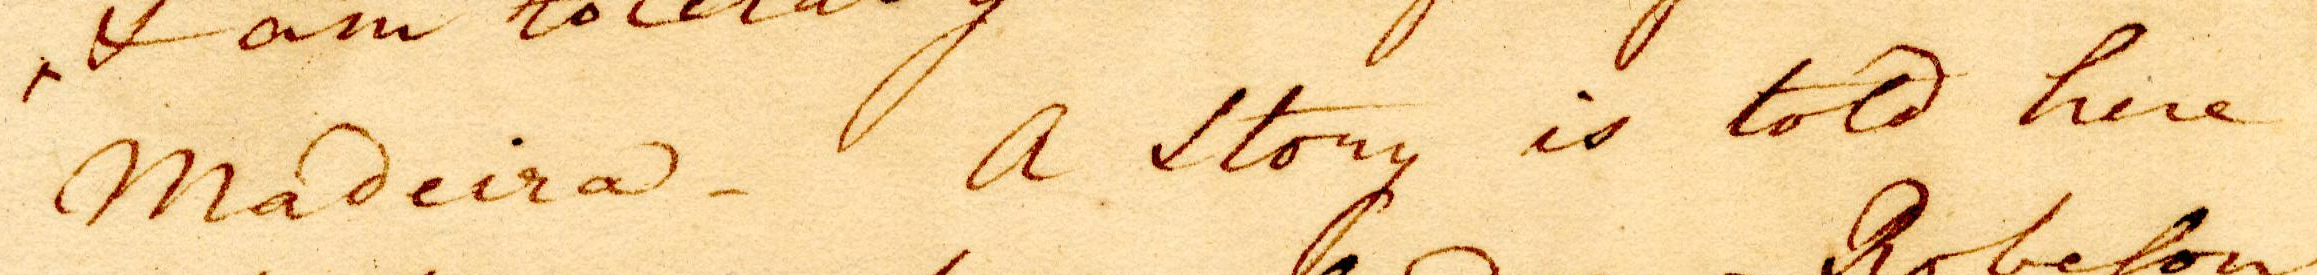Madeira. A story is told here
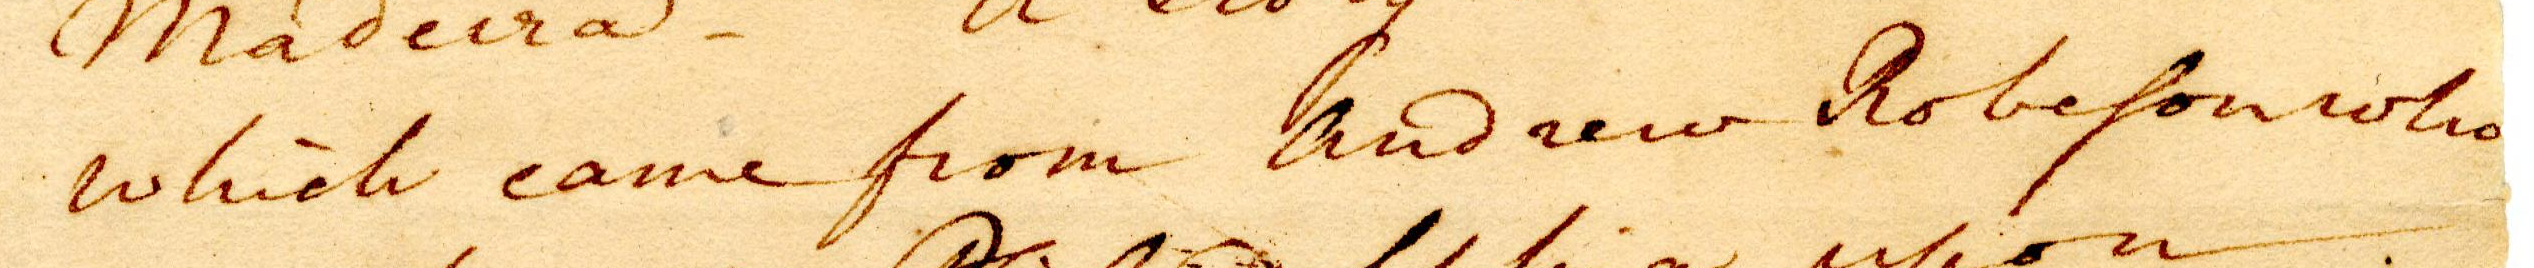which came from Andrew Robeson who
